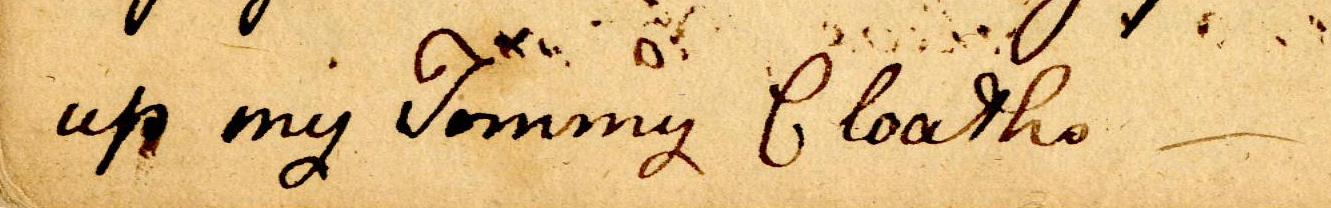up my Tommy Cloaths-
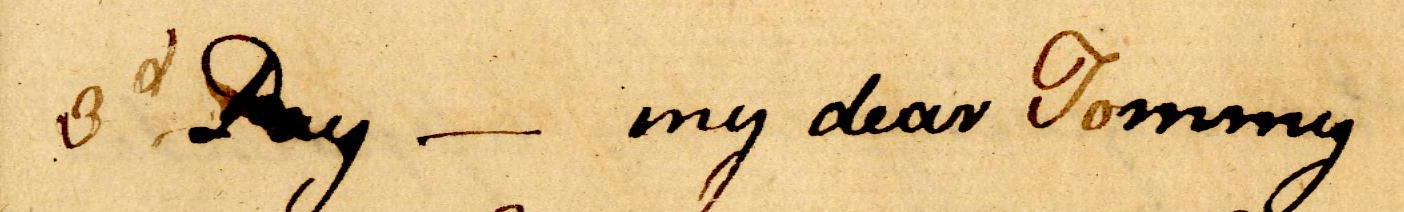3^d Day- my dear Tommy
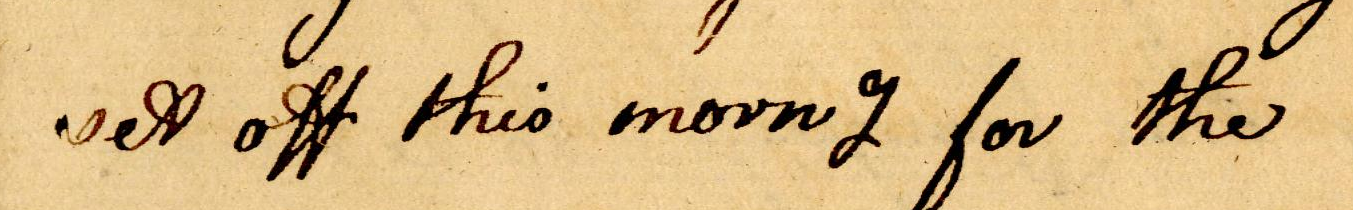set off this morn^g for the
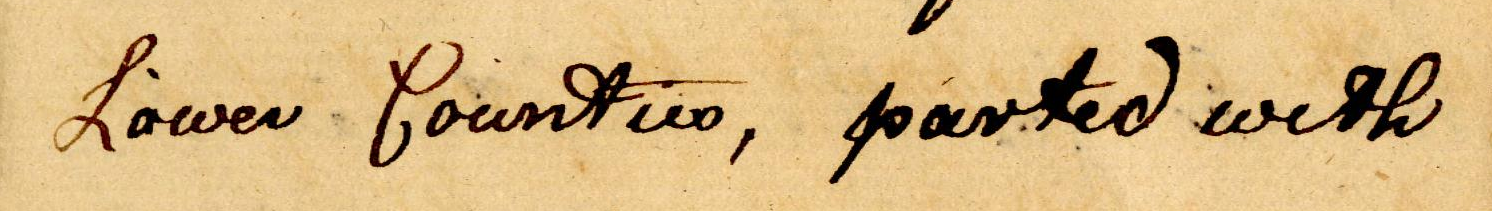Lower Counties, parted with
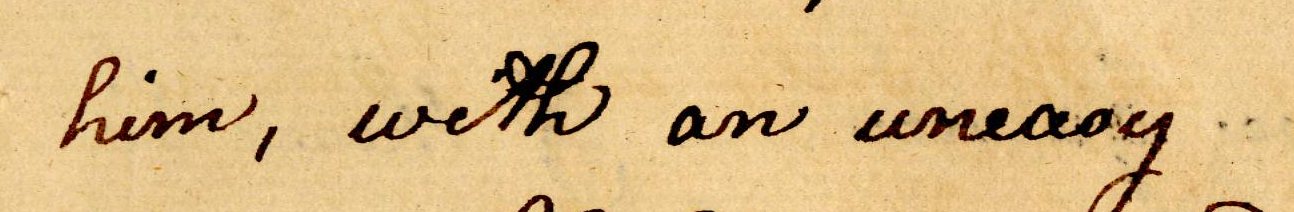him, with an uneasy
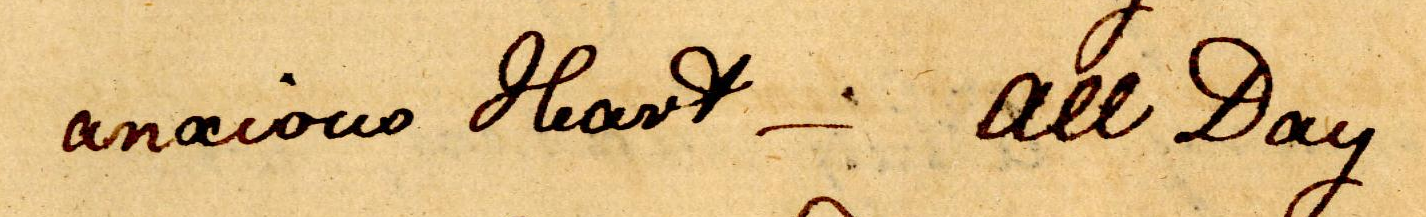anxious Heart- All Day
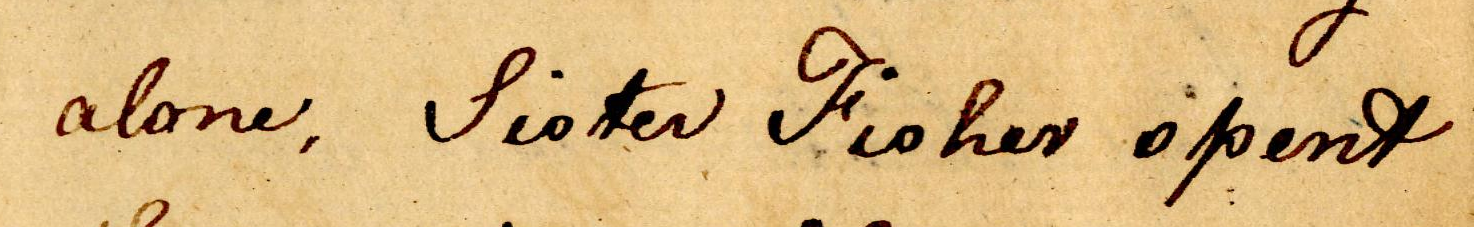alone, Sister Fisher spent
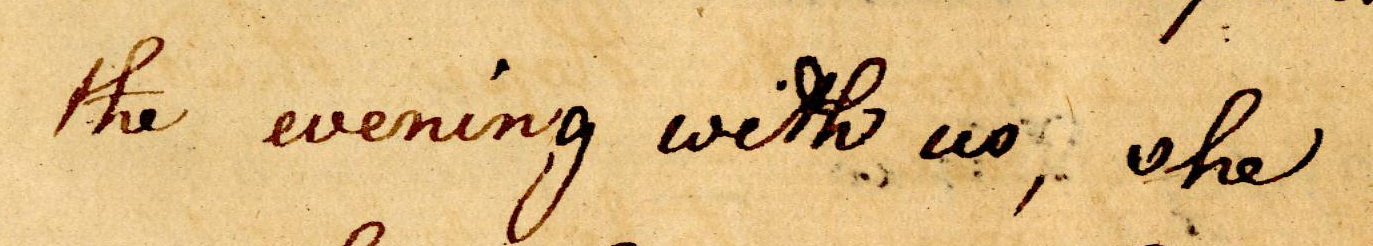the evening with us- she
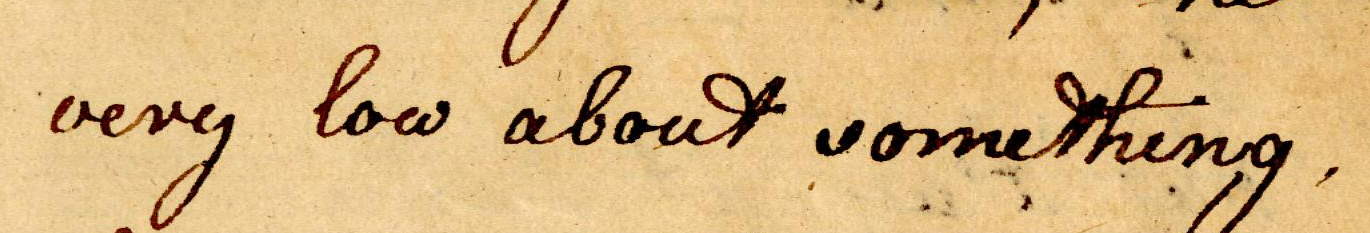very low about something,
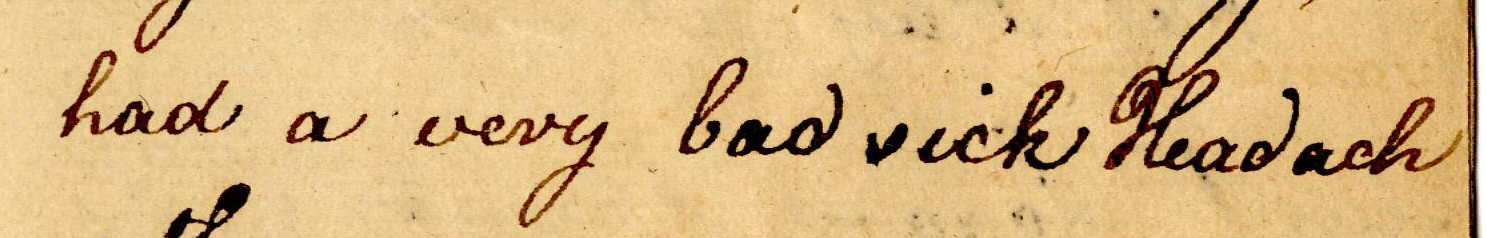had a very bad sick Headach
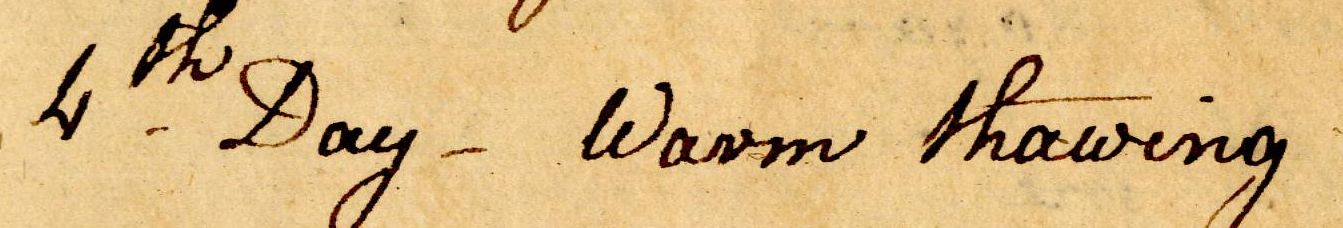4^th Day- Warm thawing
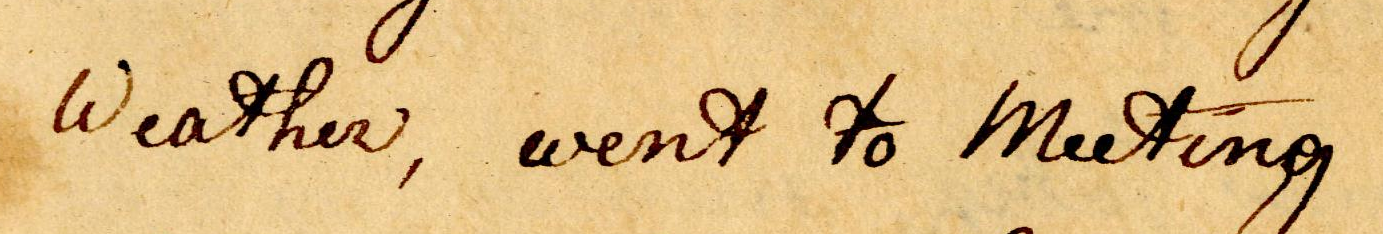Weather, went to Meeting
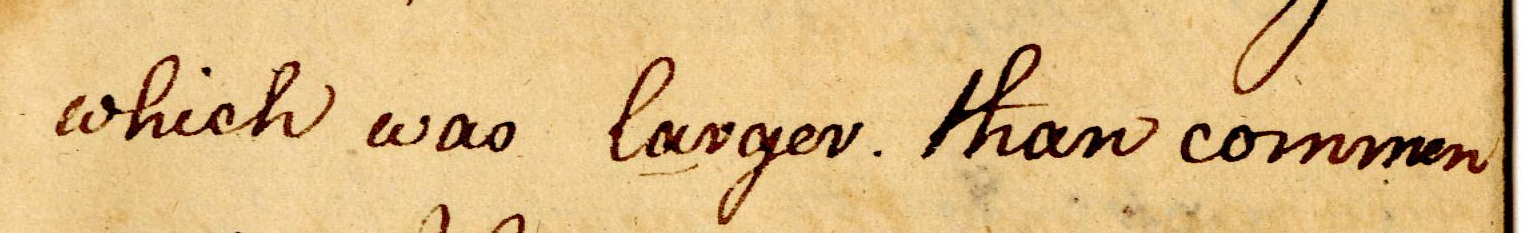which was larger. than common
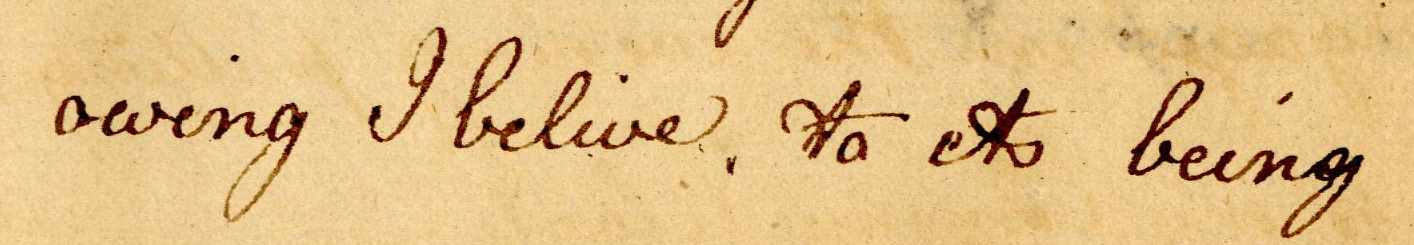owing I belive, to its being
